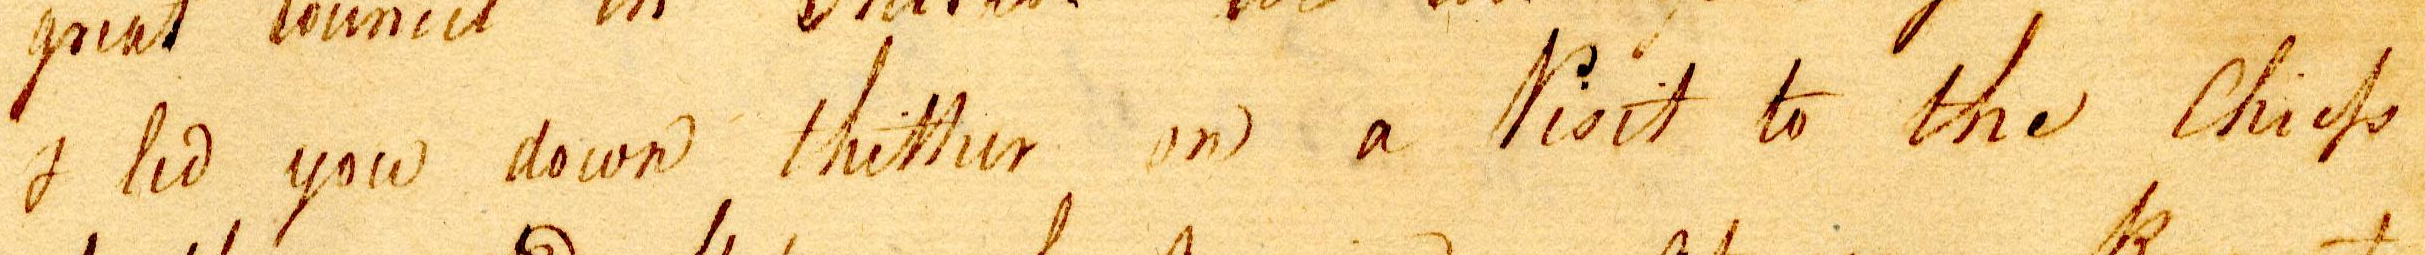& led you down thither on a Visit to the Chiefs
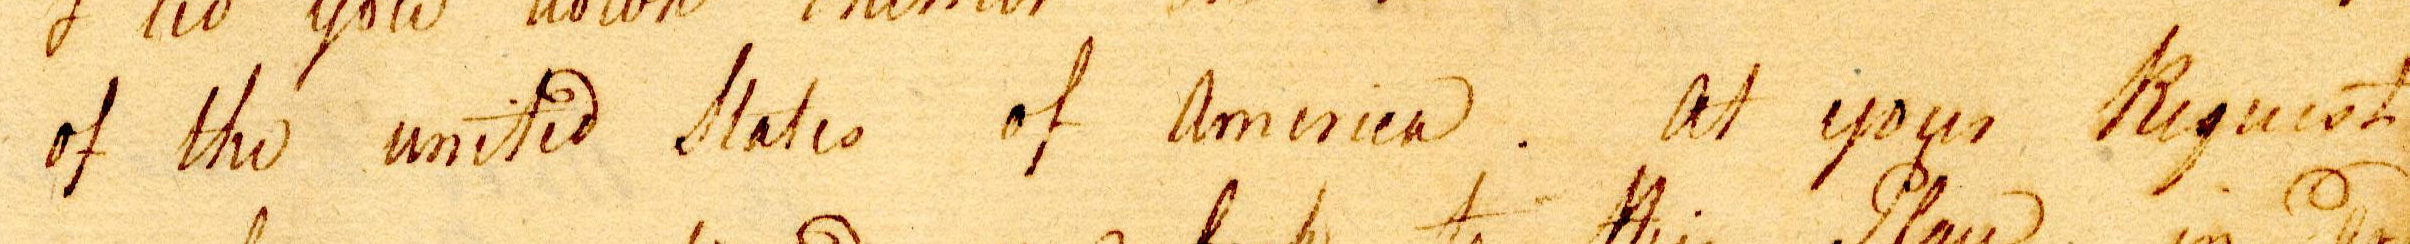of the united States of America. At your Request
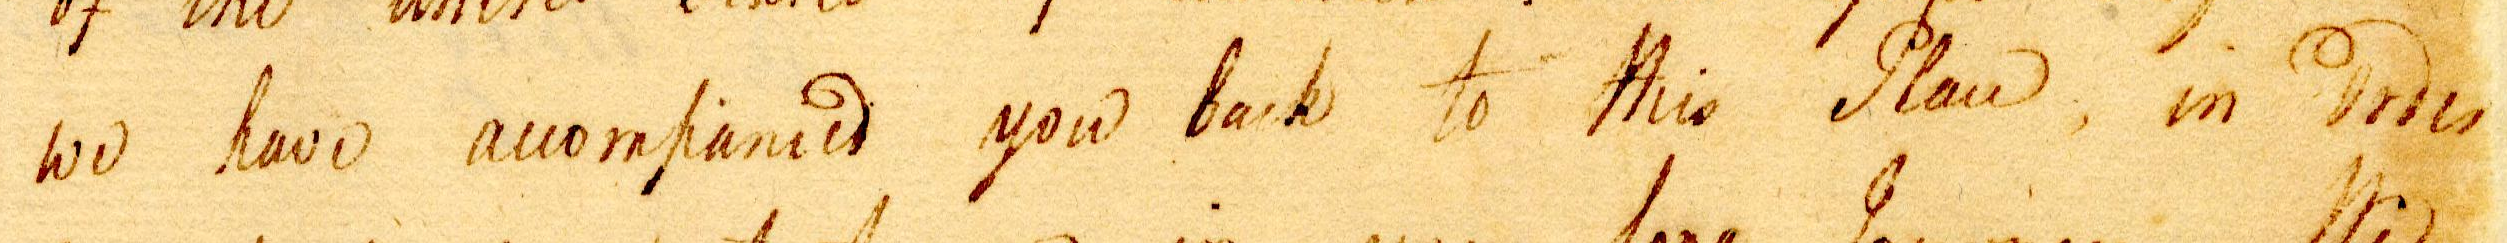we have accompanied you back to this Place, in Order
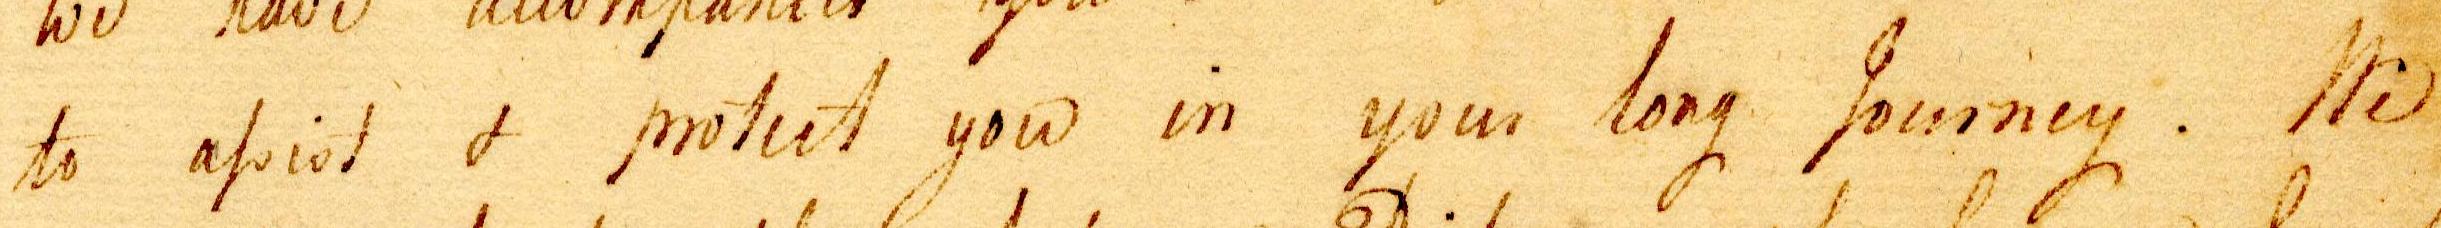to assist & protect you in your long Journey. We
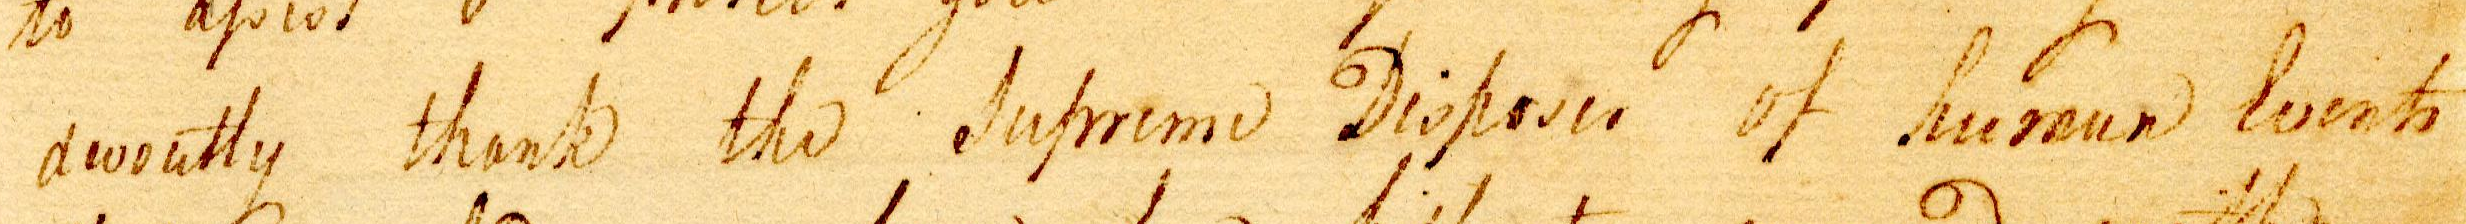devoutly thank the Supreme Disposer of human Events
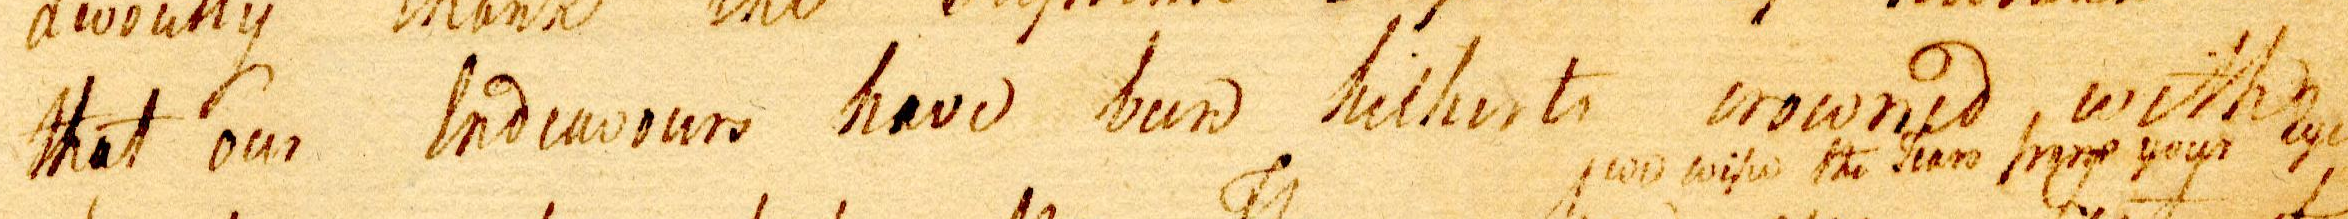that our Endeavours have been hitherto crowned, with
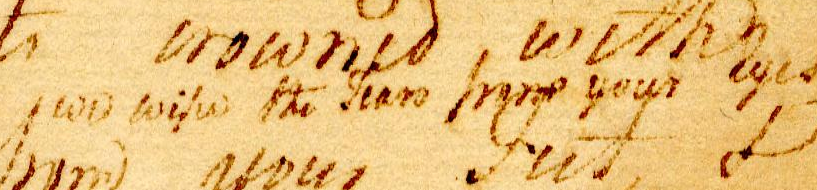we wipe the Tears from your Eyes
